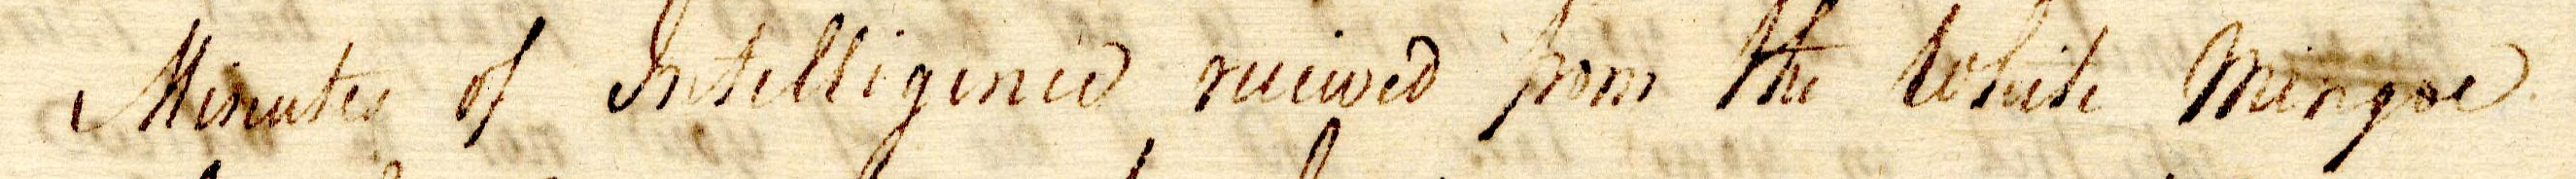Minutes of Intelligence received from the White Mingoe
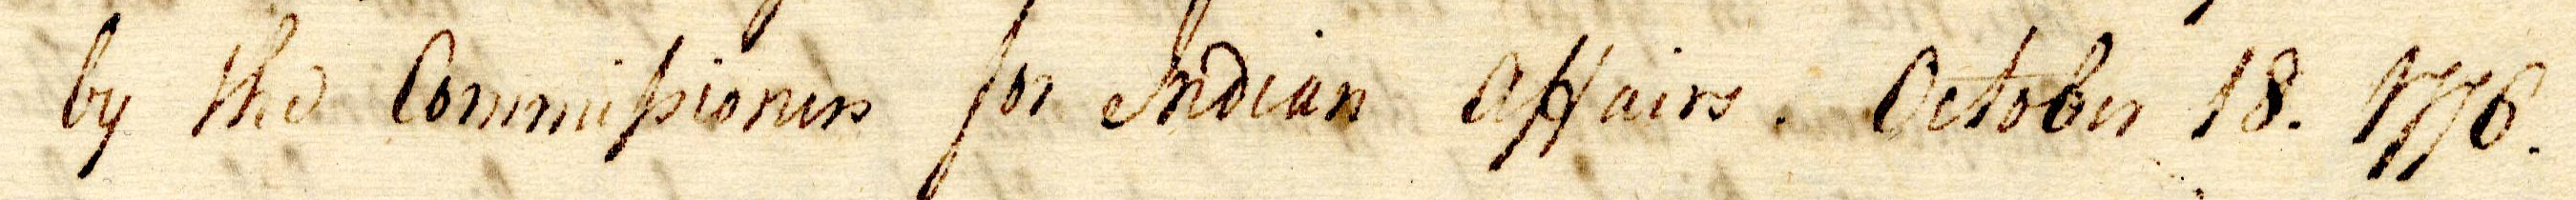by the Commissioners for Indian Affairs. October 18. 1776.
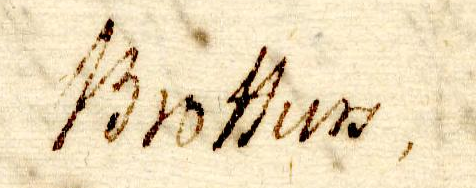Brothers,
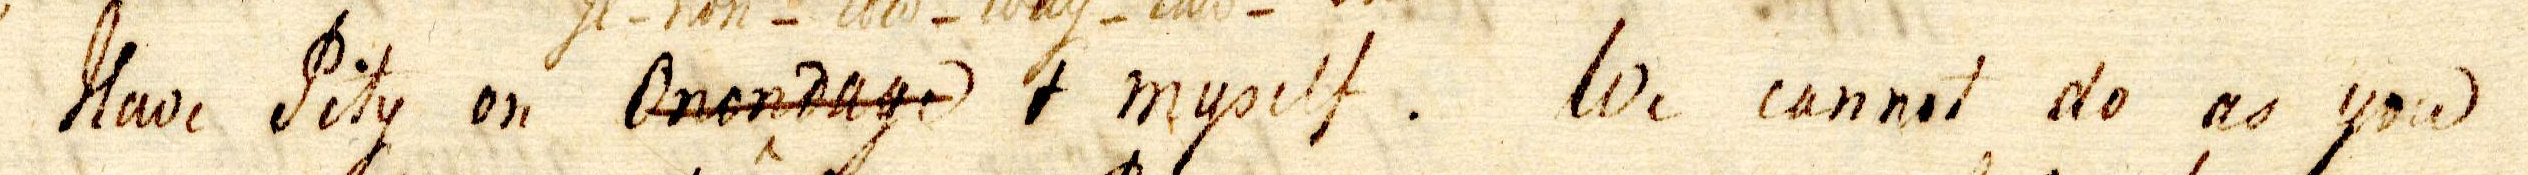Have Pity on ^ [Onondage] & myself. We cannot do as you
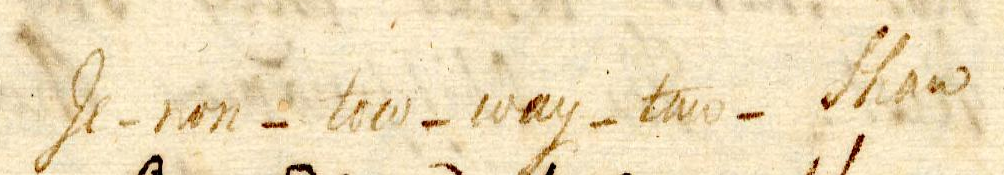Je-non-tow-way-taw-Shan
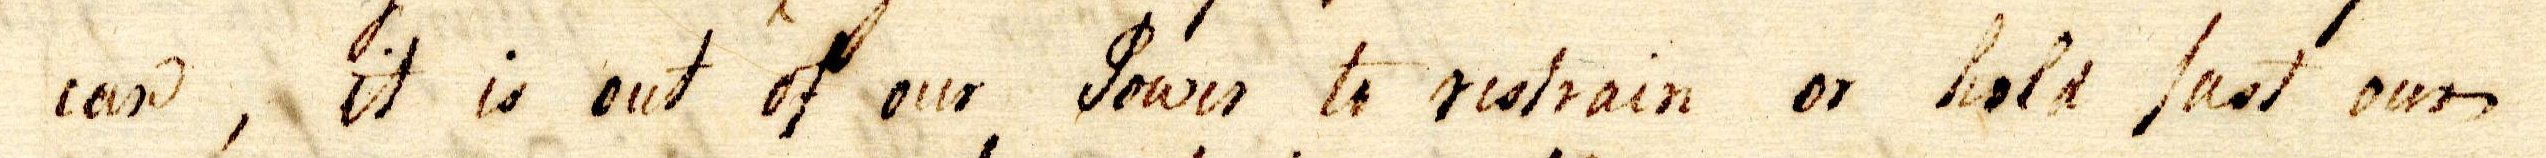can, it is out of our Power to restrain or hold fast our
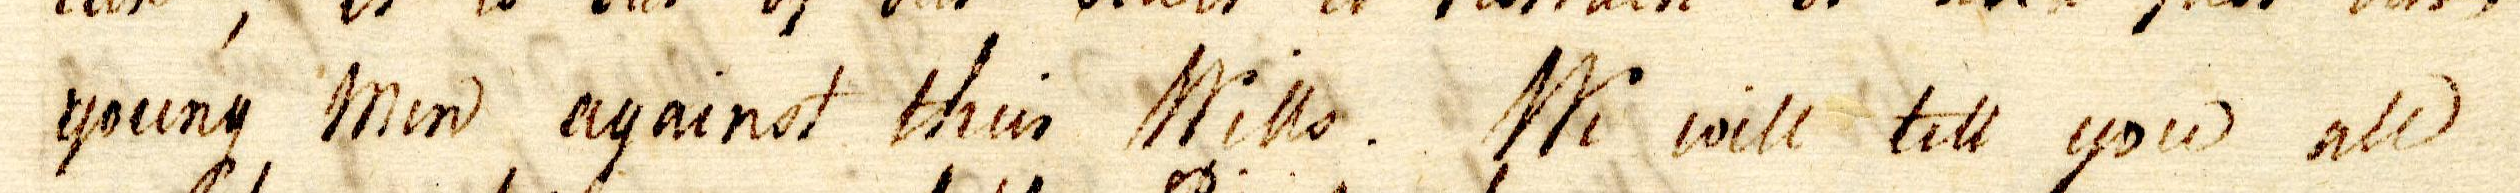young Men against their Wills. We will tell you all
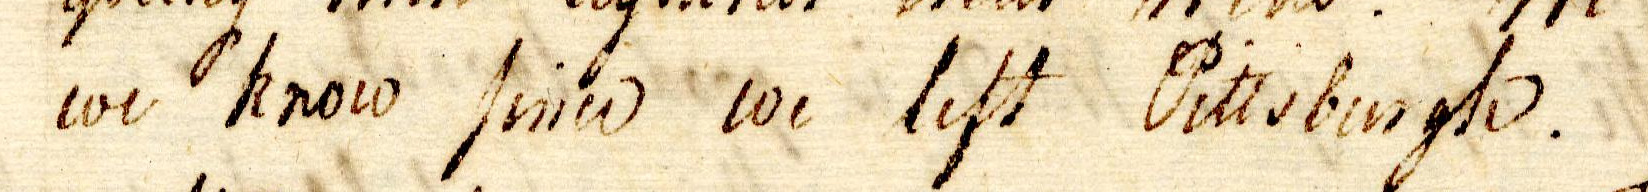we know since we left Pittsburgh.
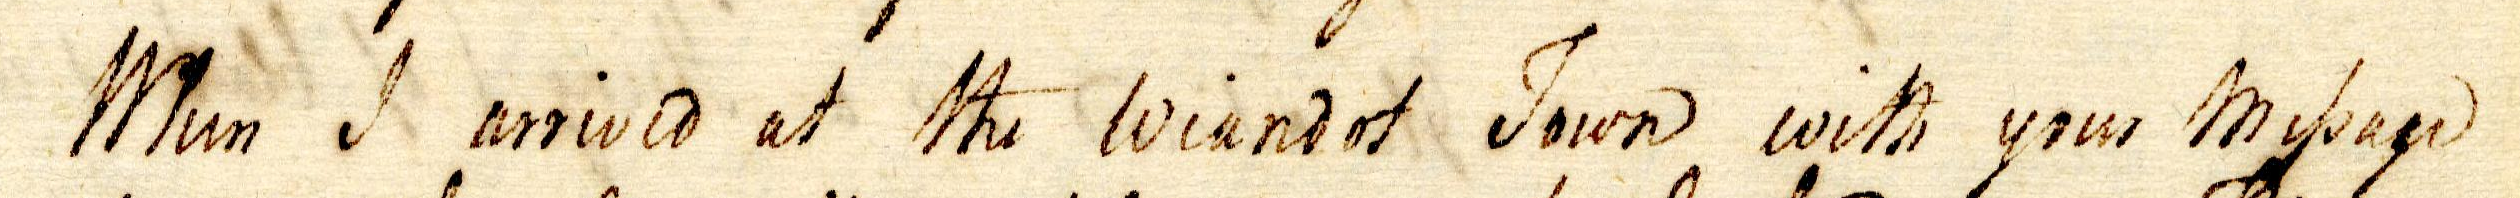When I arrived at the Wiandot Town with your Message
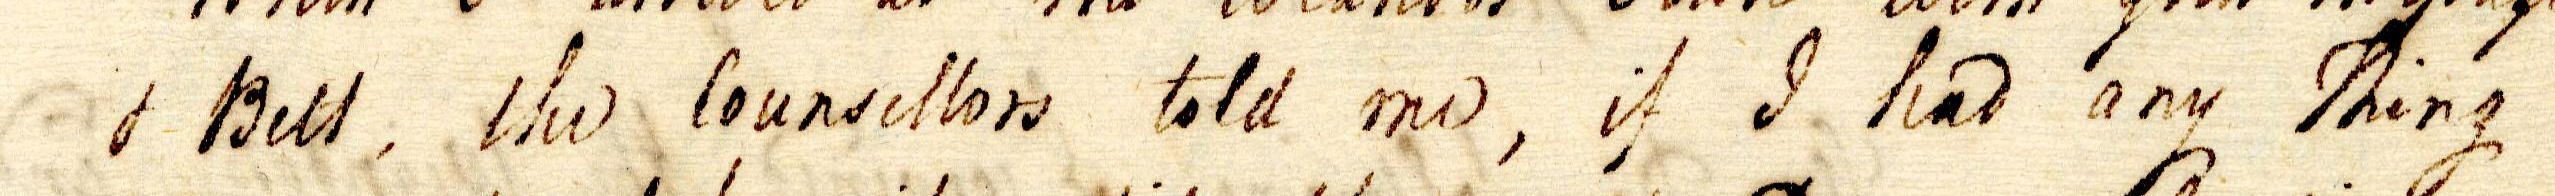& Belt, the Counsellors told me, if I had any Thing
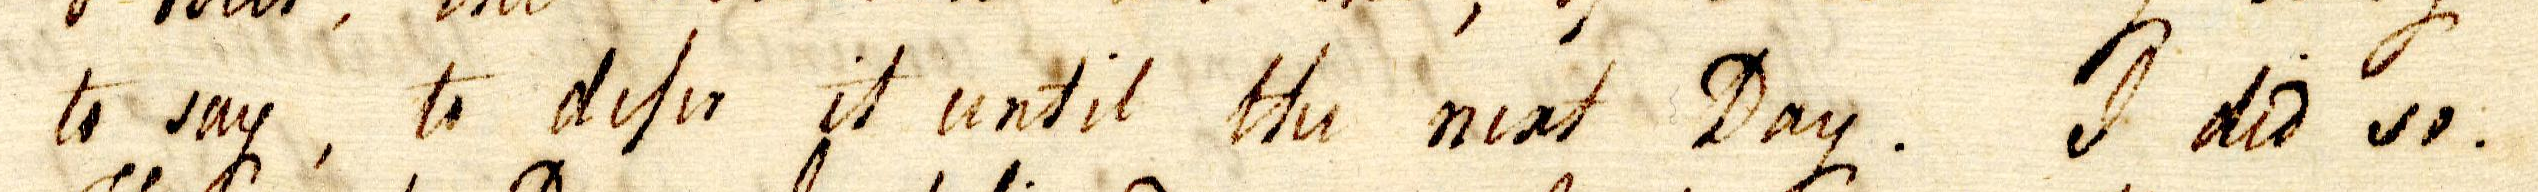to say, to defer it until the next Day. I did so.
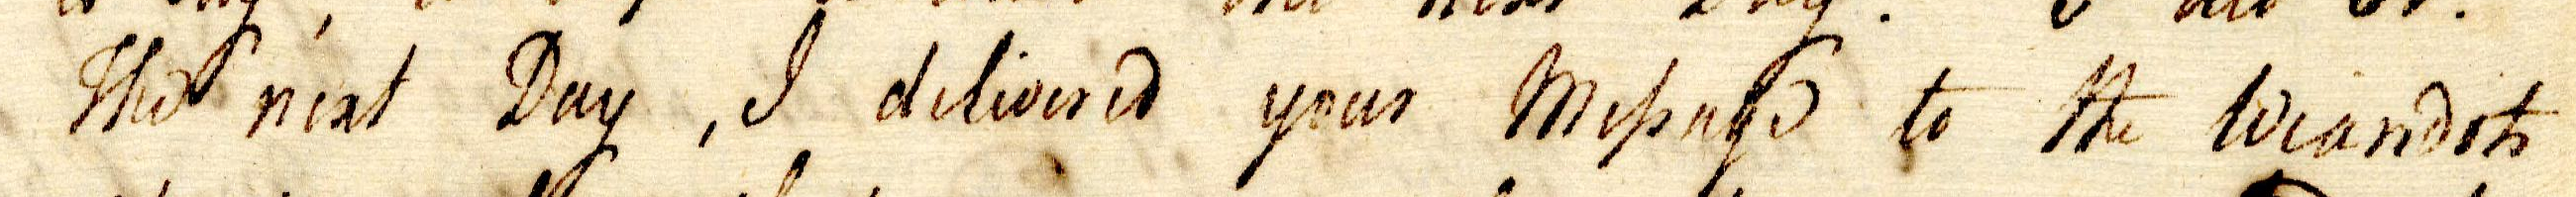The next Day, I delivered your Message to the Wiandots
